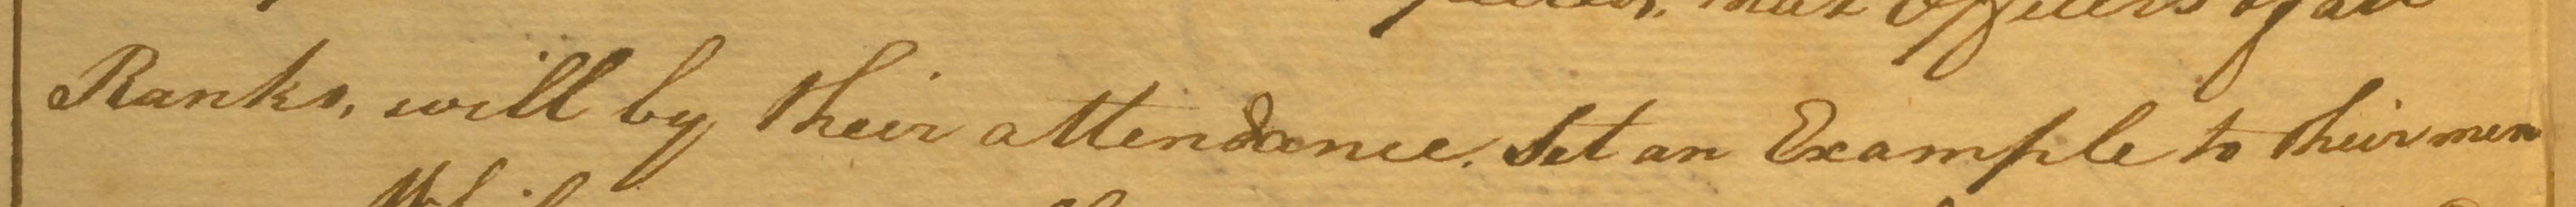Ranks will by their attendance set an Example to their men
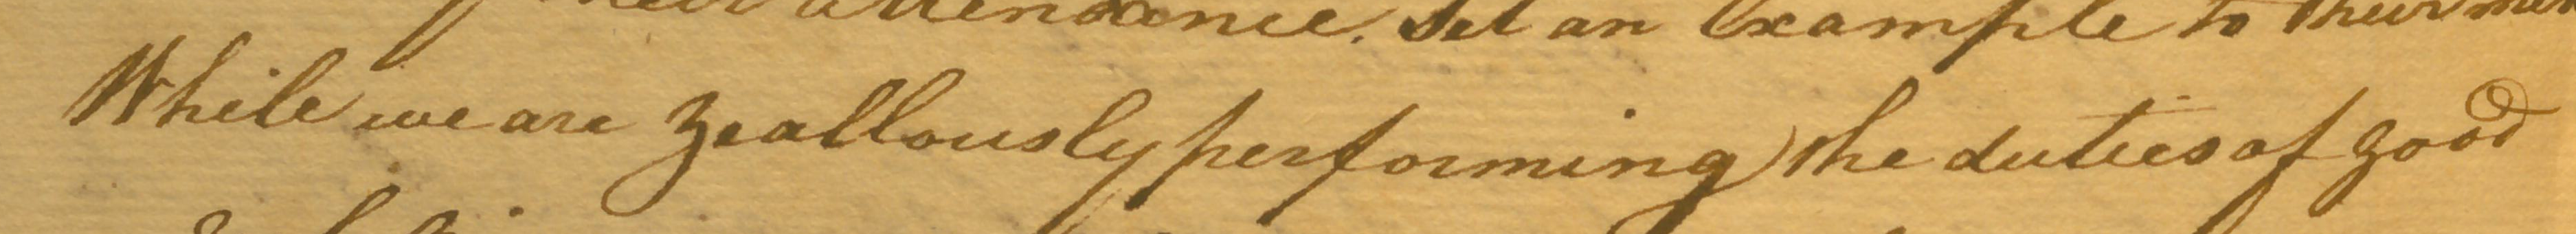While we are zeallously performing the duties of good
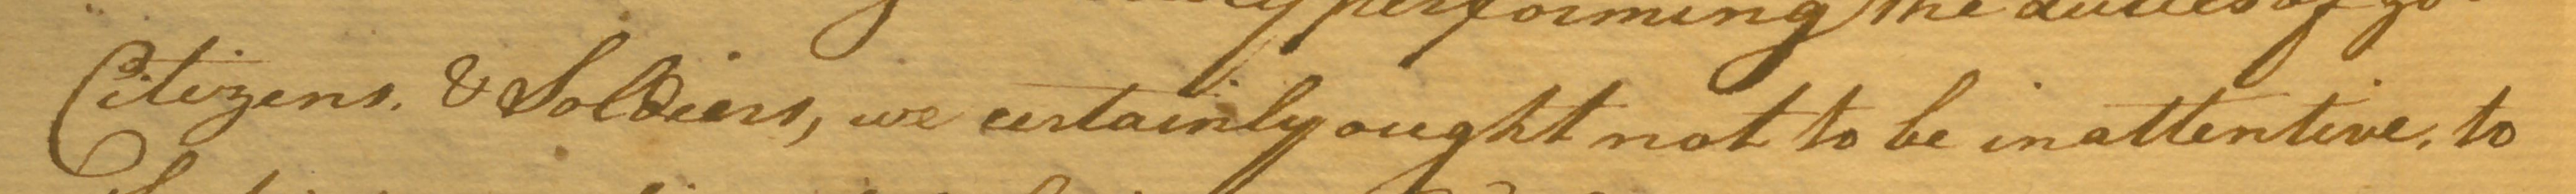Citizens & Soldiers, we certainly out not to be inattentive to
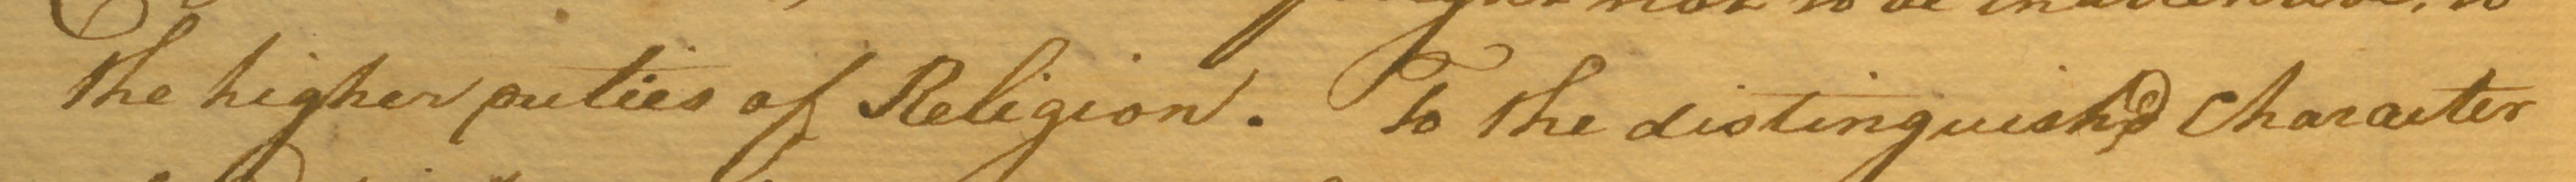the higher duties of Religion. To the distinguish'd Character
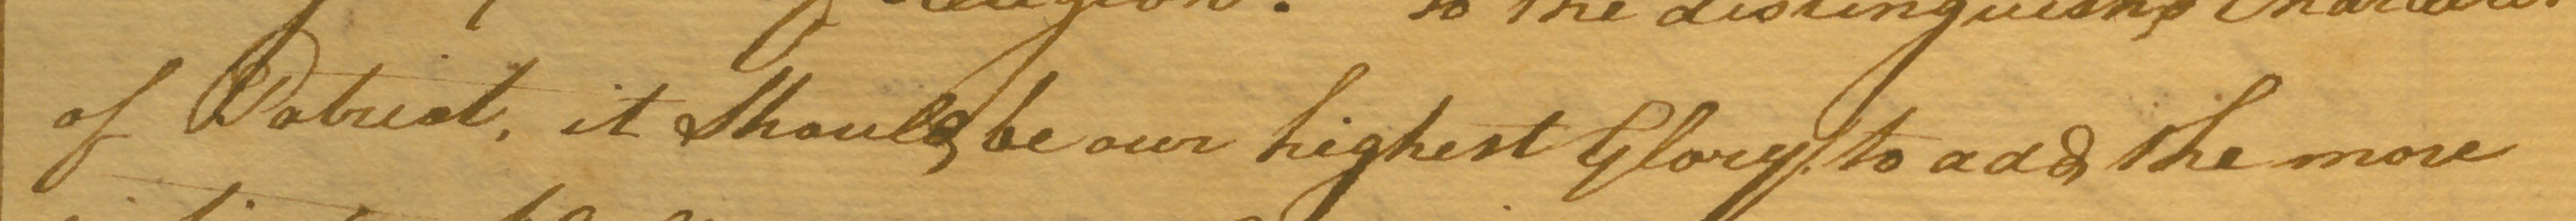of Patriot, it should be our highest Glory to add the more
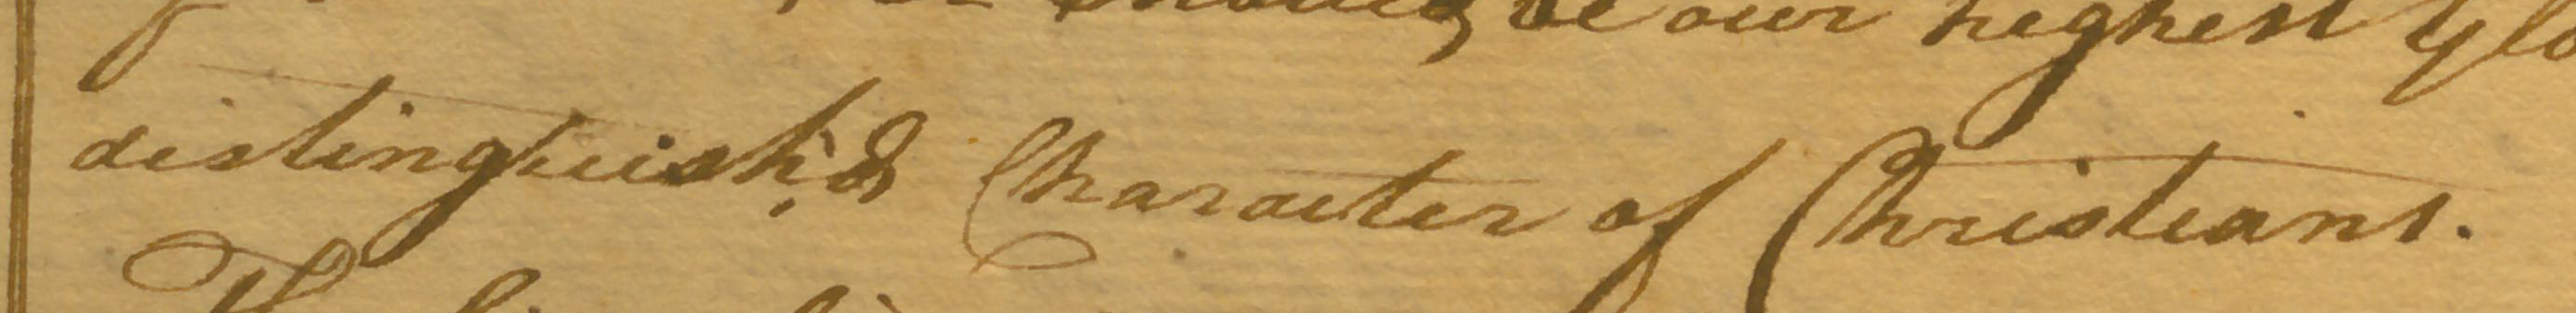distinguish'd Character of Christians.
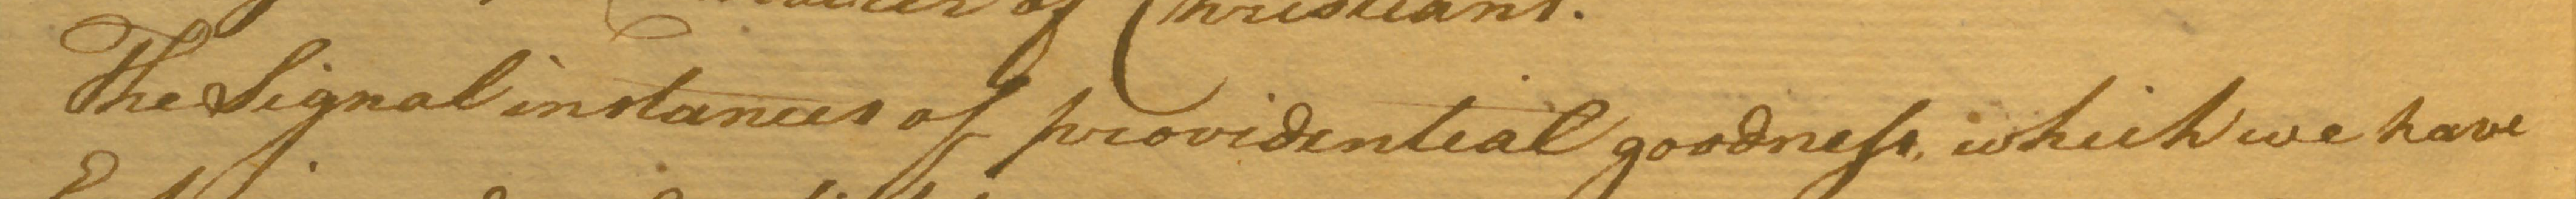The Signal instances of providential goodness which we have
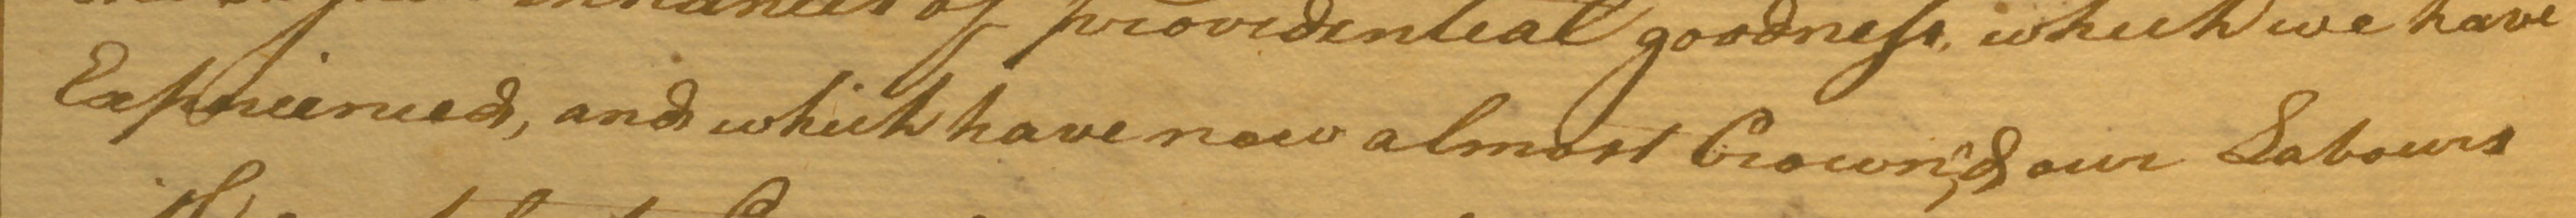Experienced, and which have now almost Crown'd our Sabours
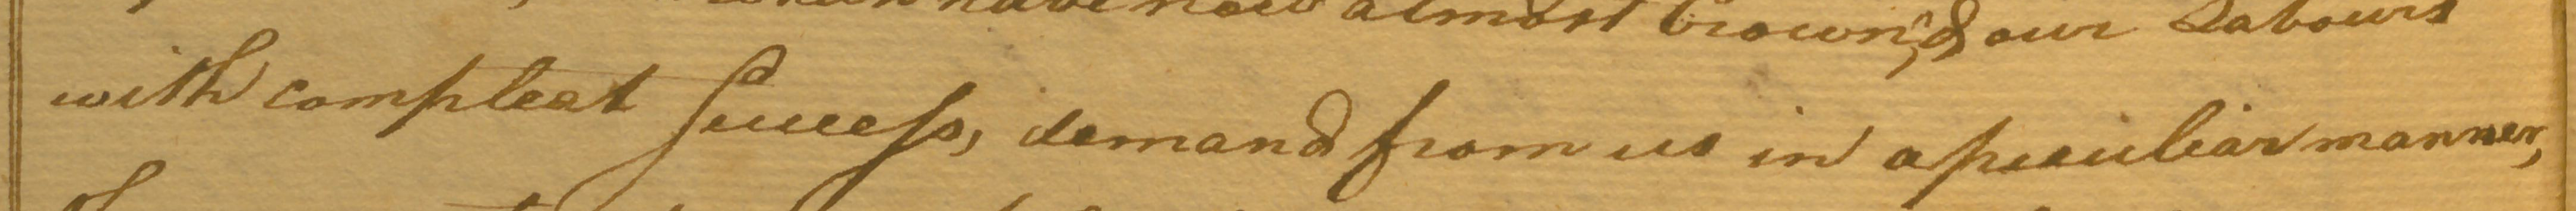with compleat success, demand from us in a peculiar manner,
